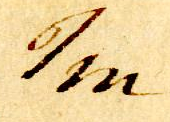Im
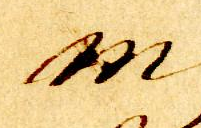M
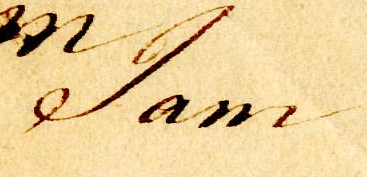Jan
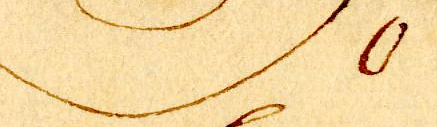To
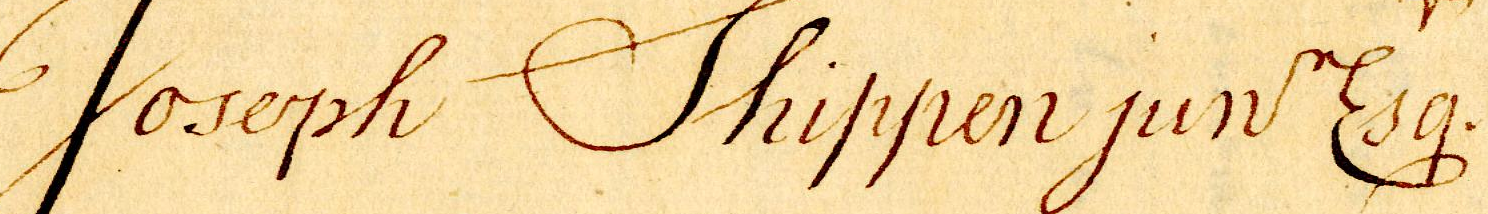Joseph Shippen jun^r Esq^r.
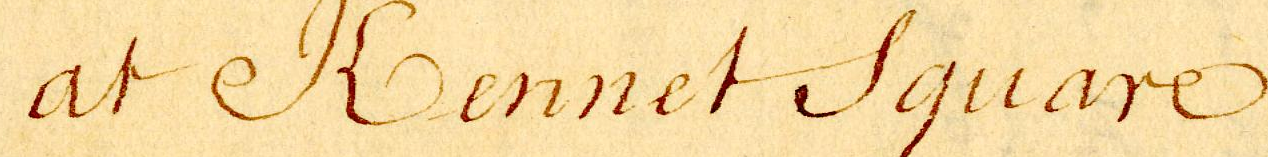at Kennet Square
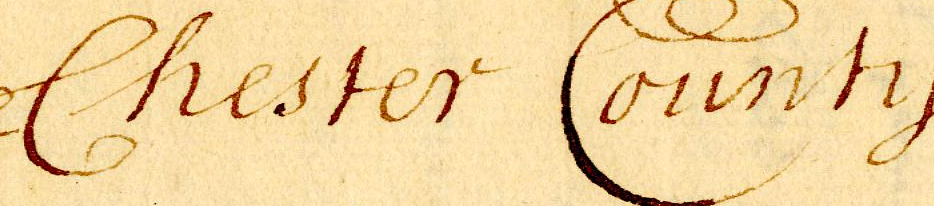Chester County
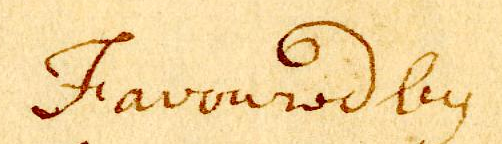Favoured by
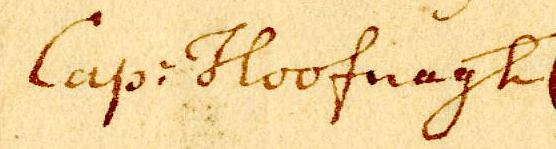Cap: Hoofnagle
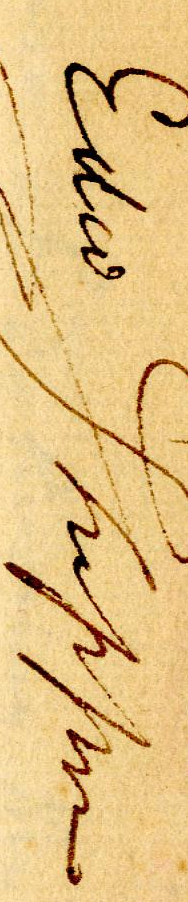Edw Shippen
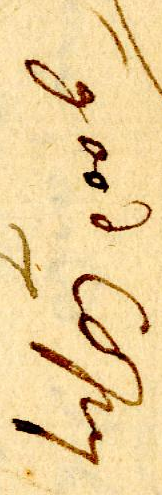good Copy
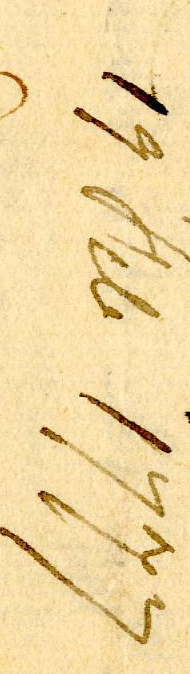19 Feb 1777
